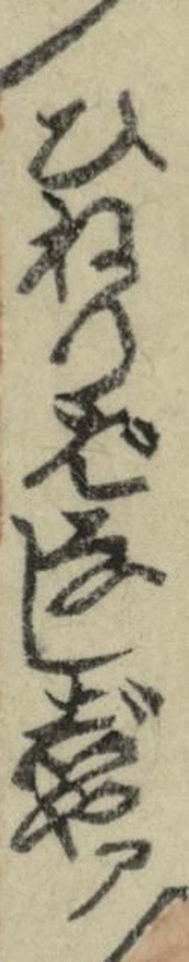ひねりばなしじやァ
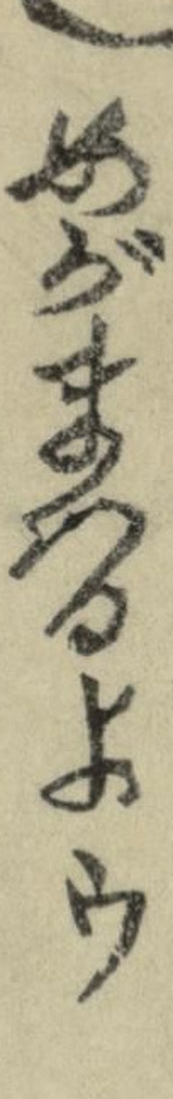めがまはるよゥ
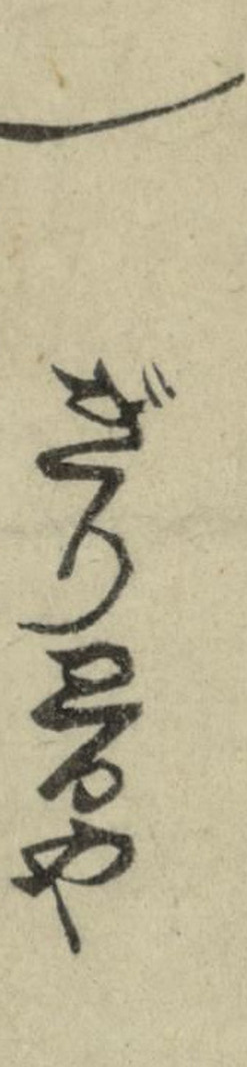ぎりわるや
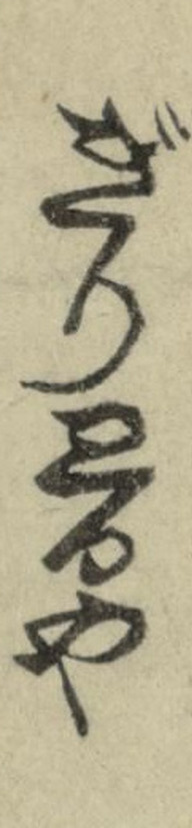ぎりわるや
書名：治る御代　ひやかし鯰
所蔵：東京大学地震研究所図書室 Earthquake Research Institute Library, The University of Tokyo, JAPAN
